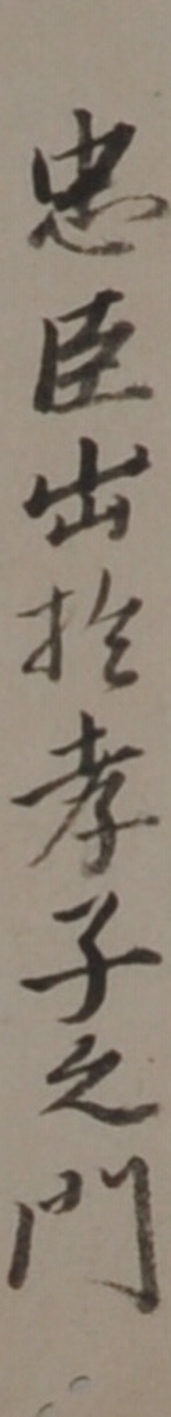忠臣出於孝子之門
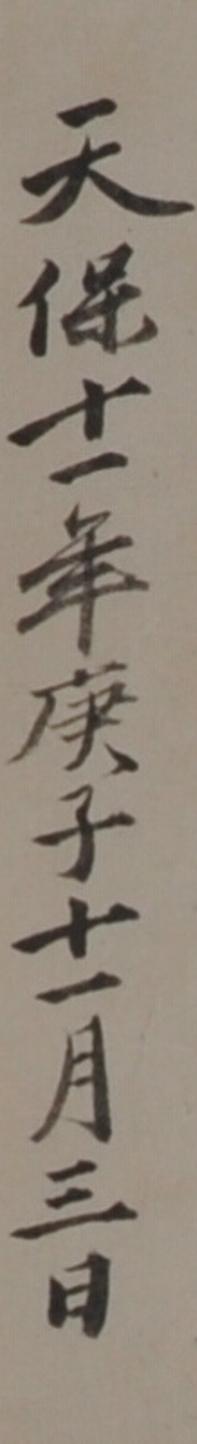天保十一年庚子十一月三日
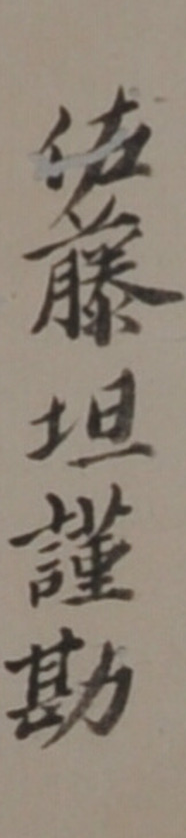佐藤坦謹勘
